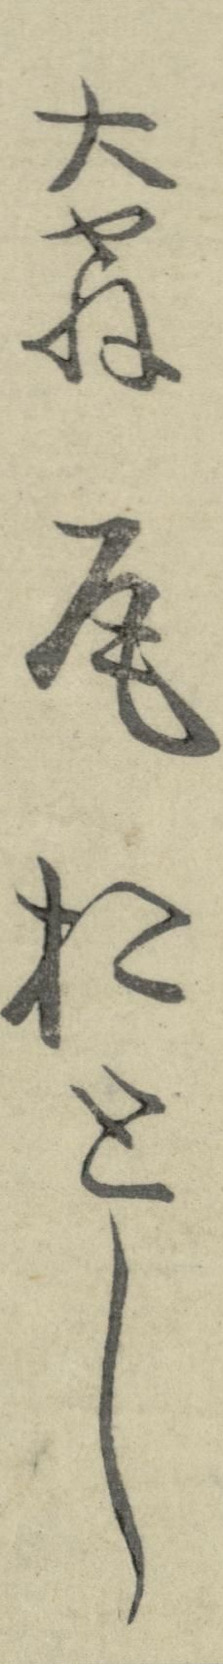大やね瓦おとし
